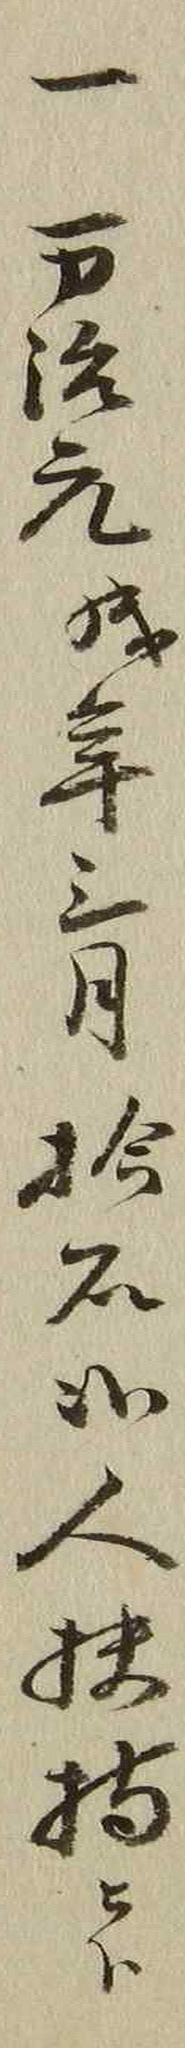一万治元戌年三月拾石弐人扶持被下
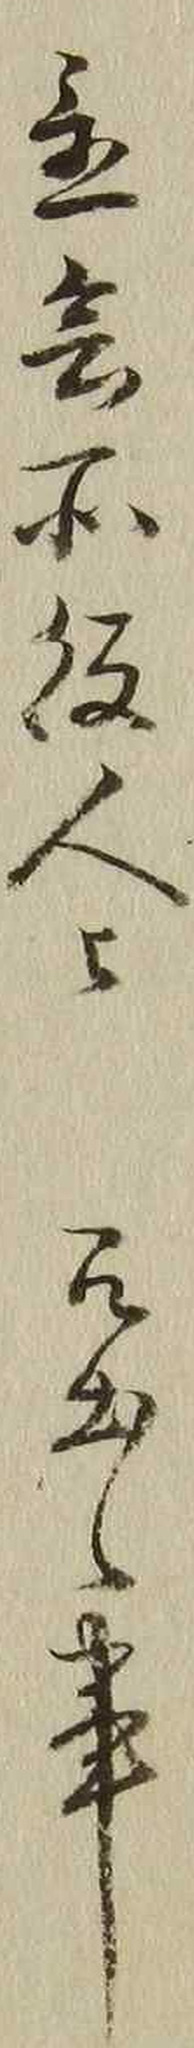置会所役人被召出候事
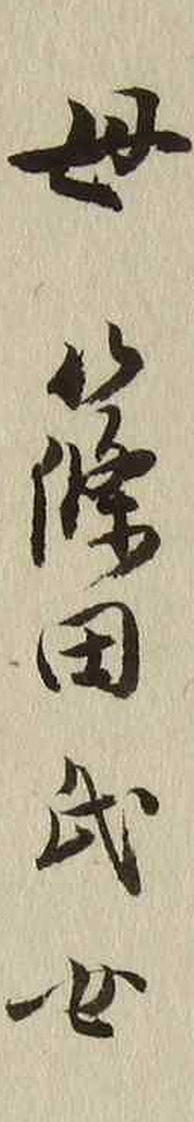母篠田氏女
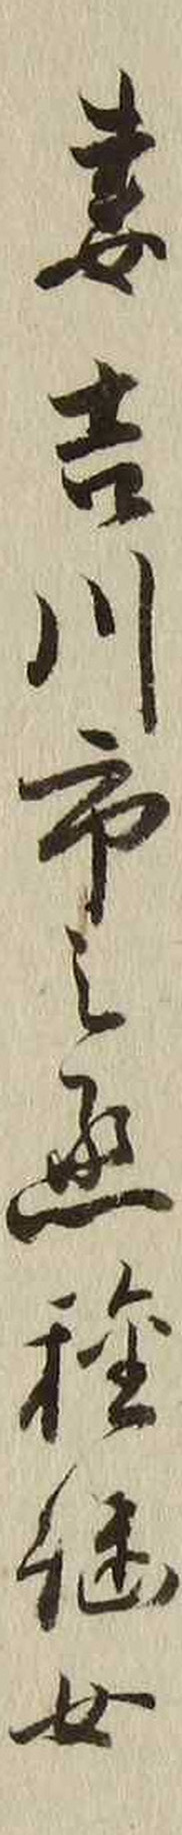妻吉川市之丞種継女
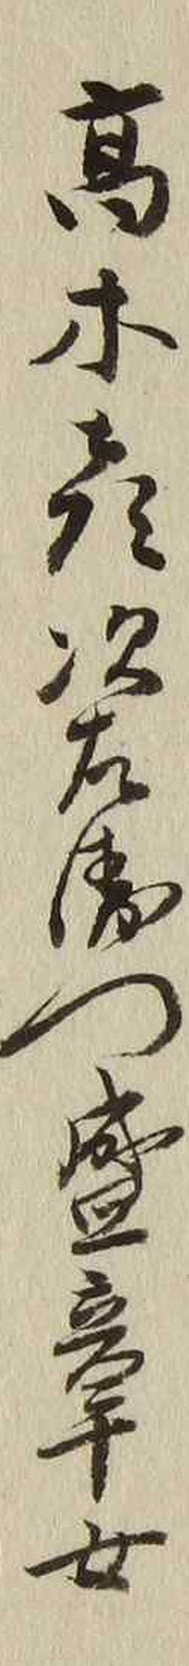高木彦次右衛門盛章女

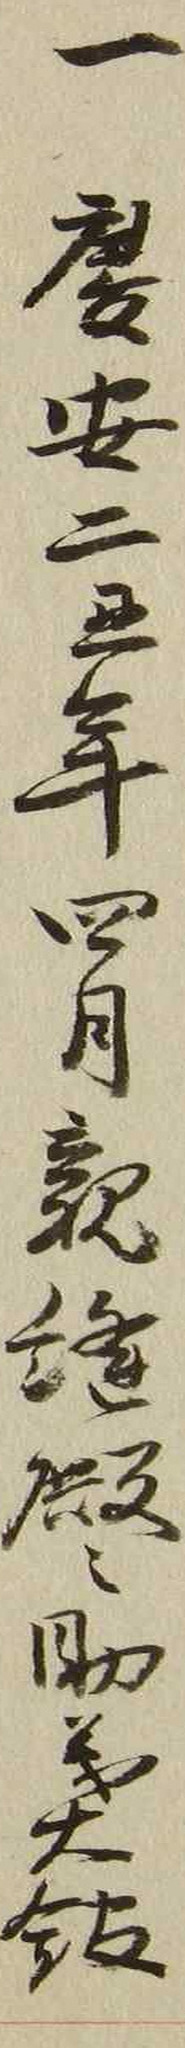一慶安二丑年四月親縫殿之助弟大館
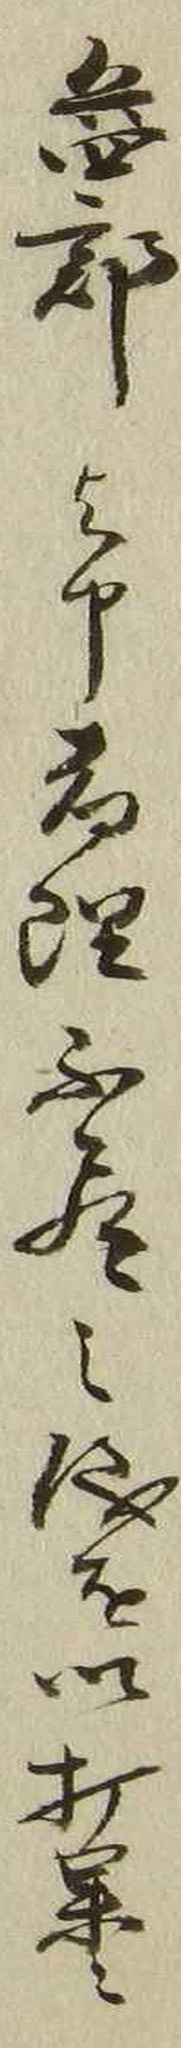兵四郎と申者理不尽之儀を以打果ニ
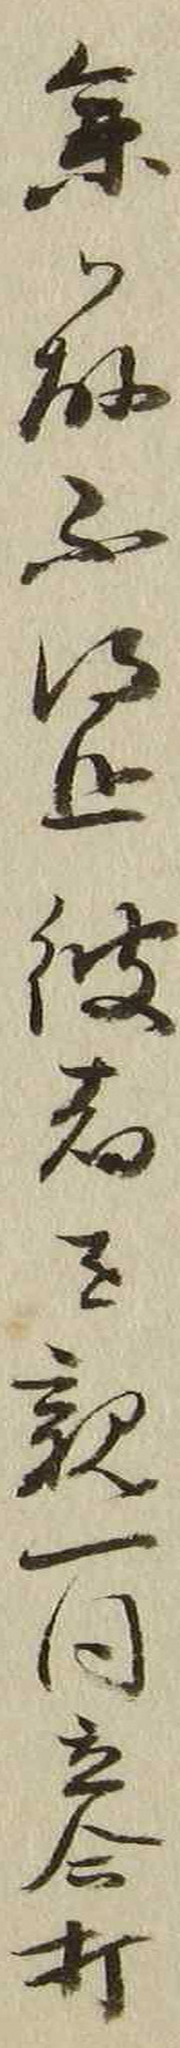参候故不得止彼者を親一同立合打
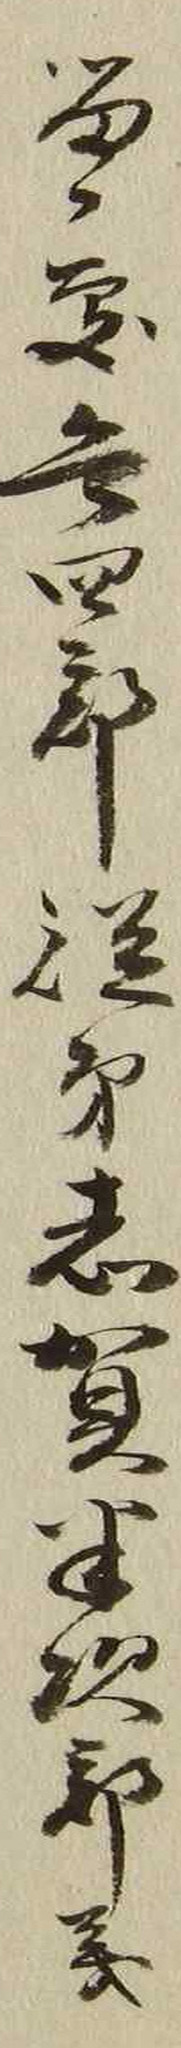留候処兵四郎従弟志賀半次郎義
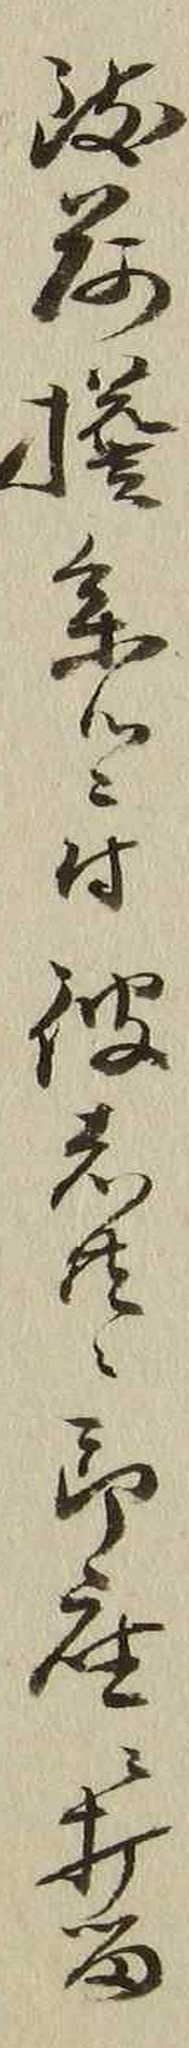致荷擔参候ニ付彼者共々即座ニ打留
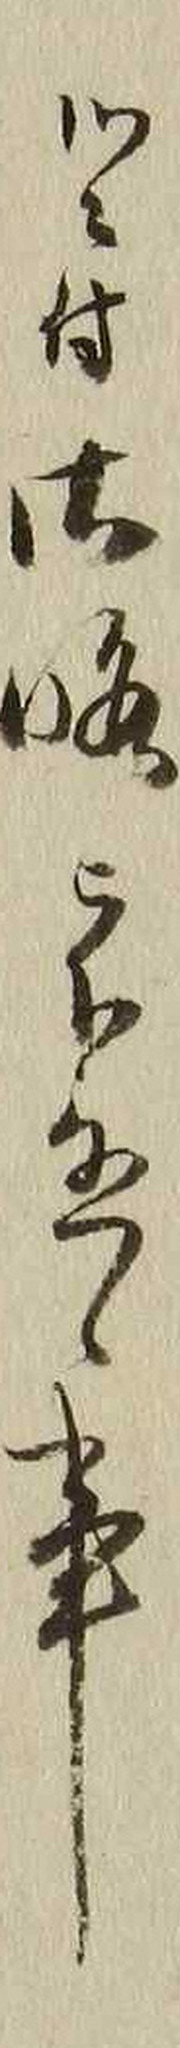候ニ付御暇被下置候事
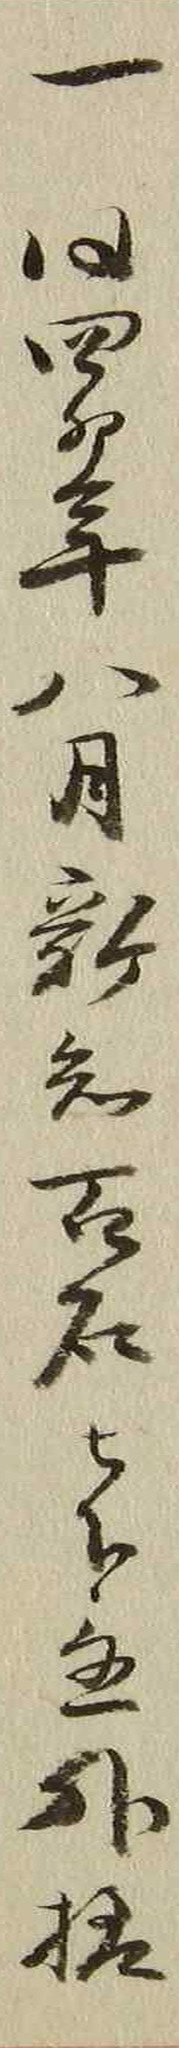一同四卯年八月新知百石被下置外様
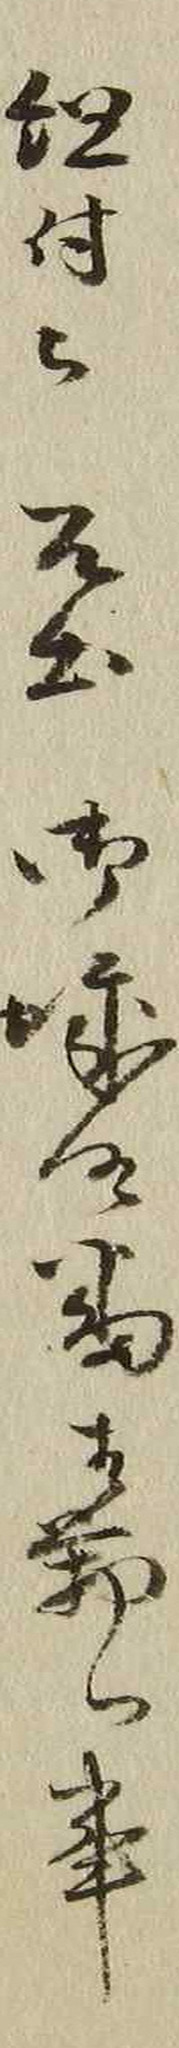組付被召出御城御番相勤候事
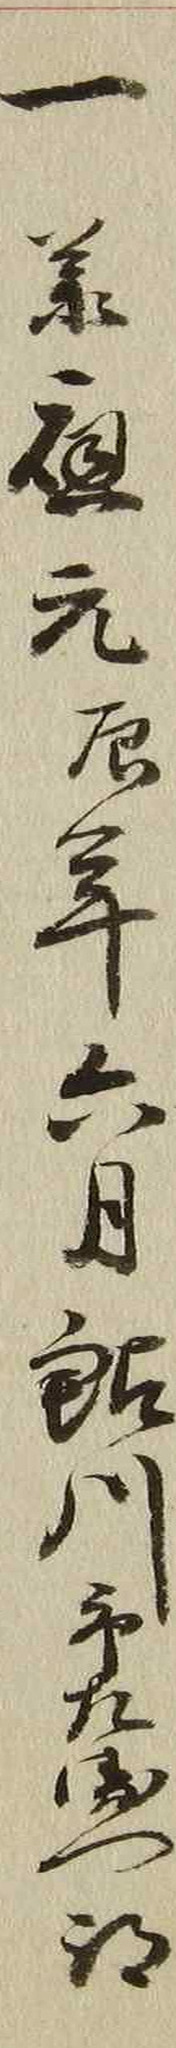一承応元辰年六月鮎川市左衛門跡
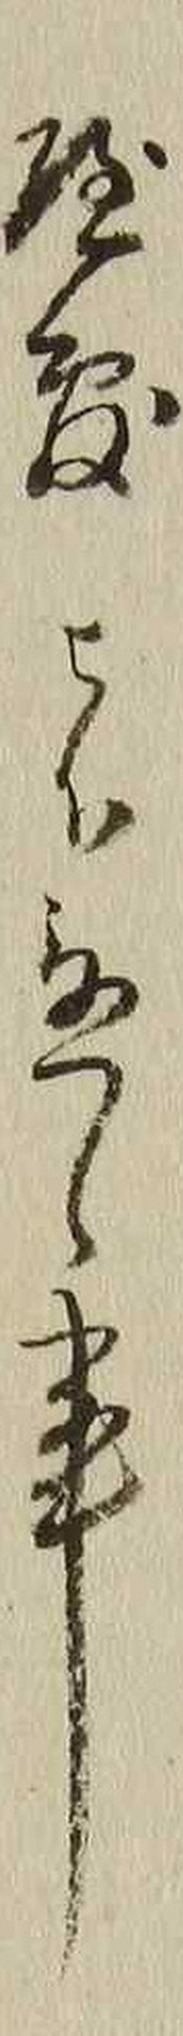屋敷被下置候事
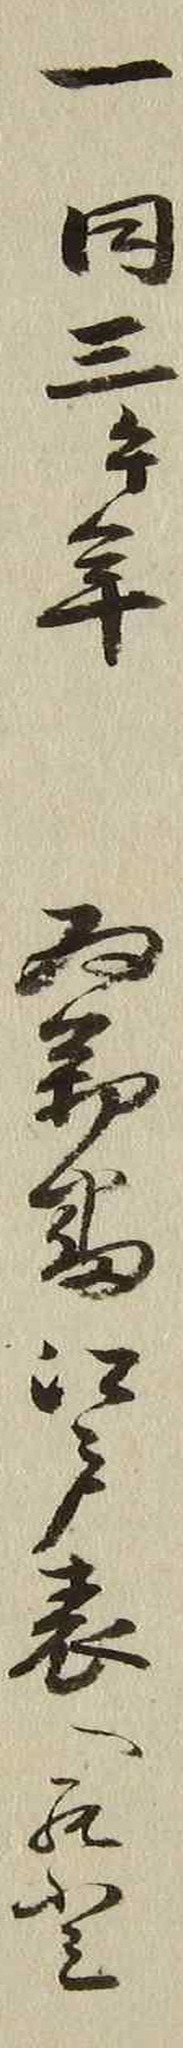一同三午年為勤番江戸表へ罷登
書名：諸士系譜　巻之236　ふ之部4
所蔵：会津若松市立会津図書館
